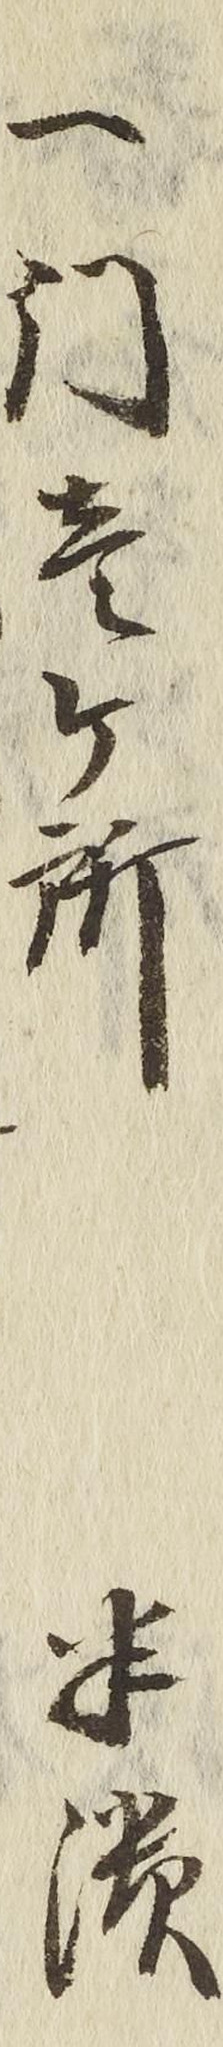一門壱ヶ所半潰
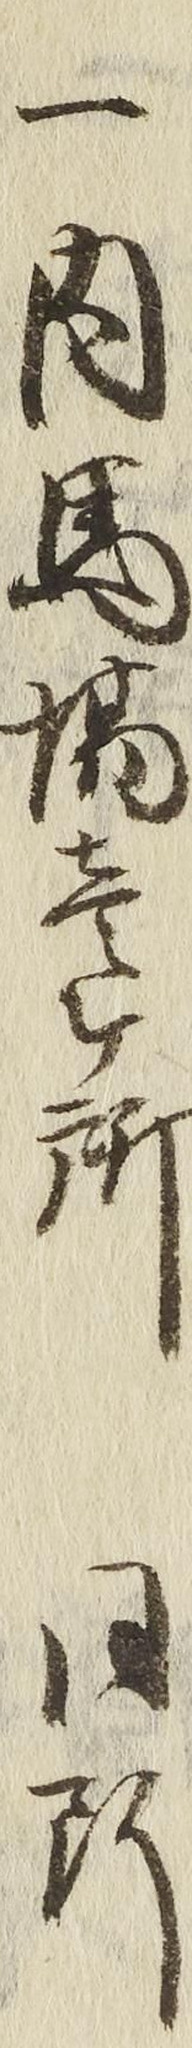一内馬場壱ヶ所同断
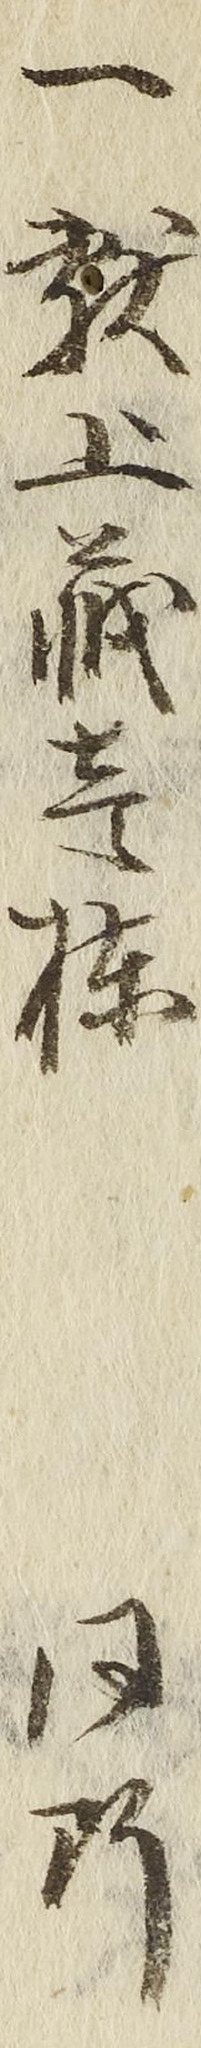一献上蔵壱棟同断
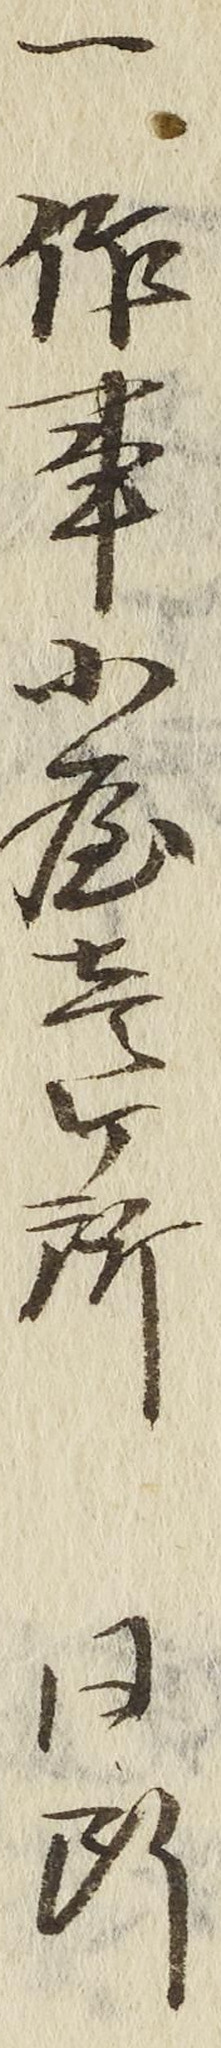一作事小屋壱ヶ所同断
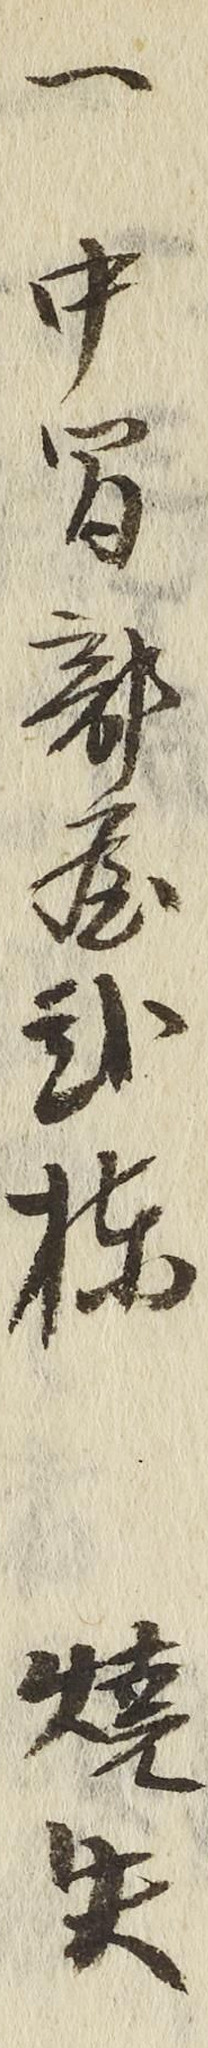一中間部屋弐棟焼失
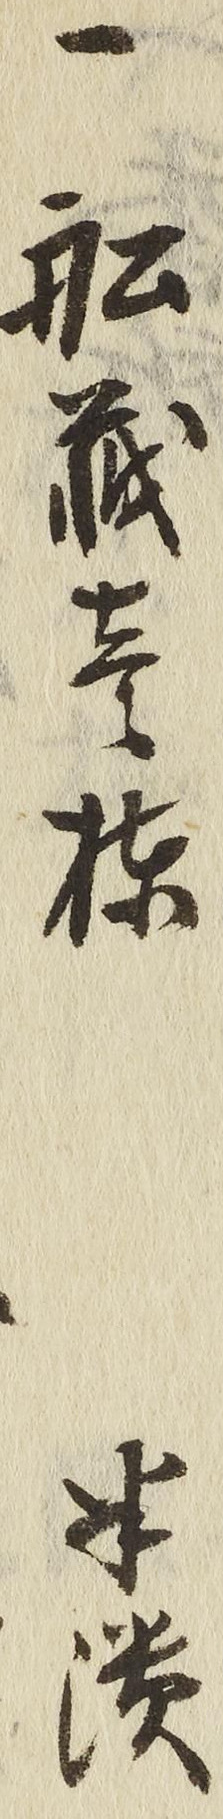一船蔵壱棟半潰
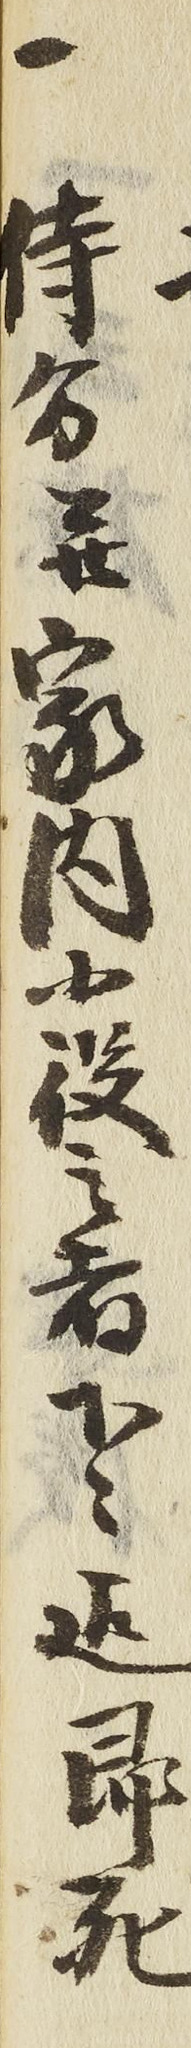一侍分并家内小役之者下々迄即死
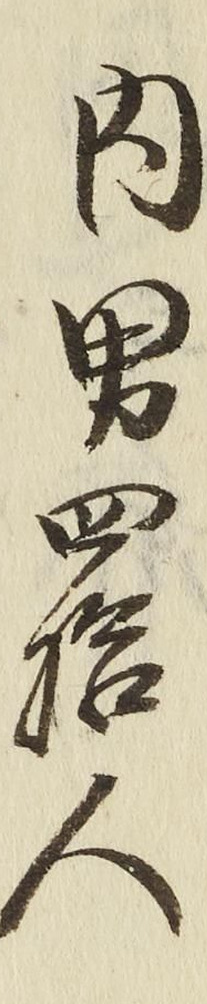内男四拾人
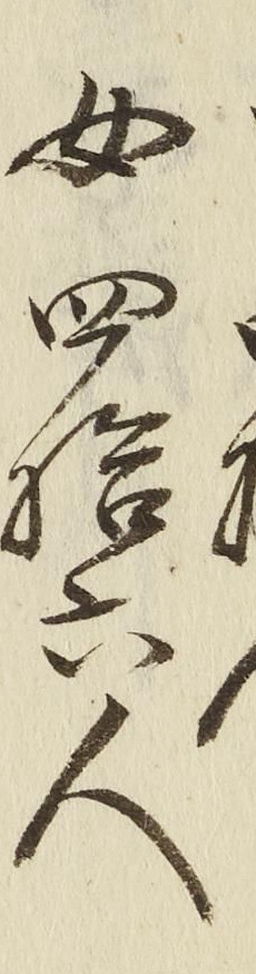女四拾六人
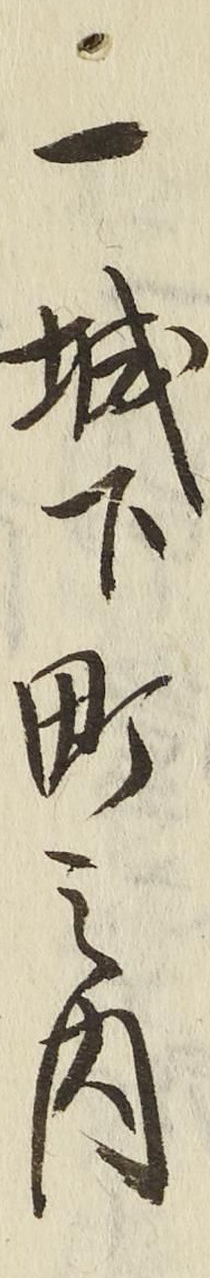一城下町之内
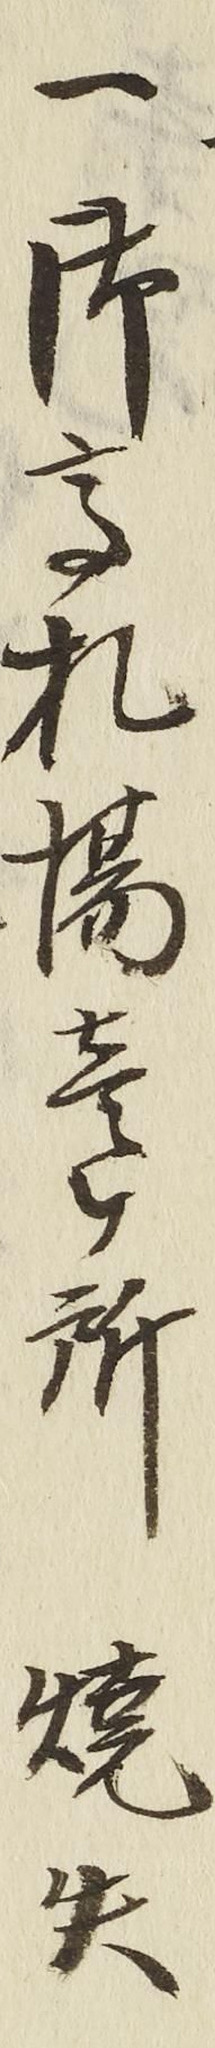一御高札場壱ヶ所焼失
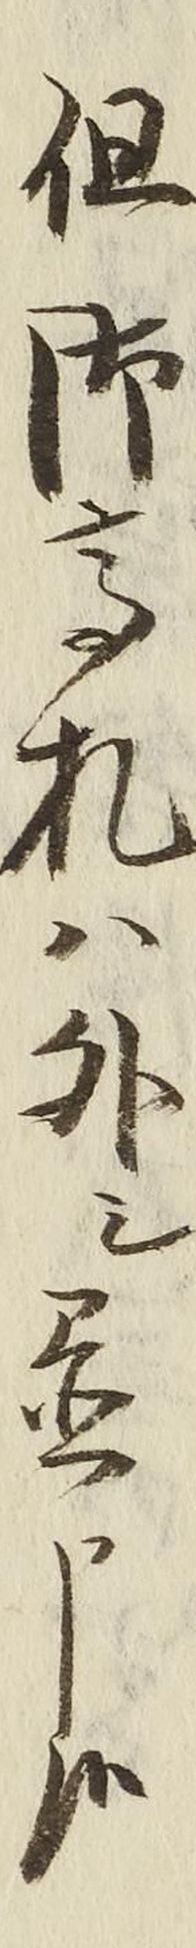但御高札ハ外レ置申候
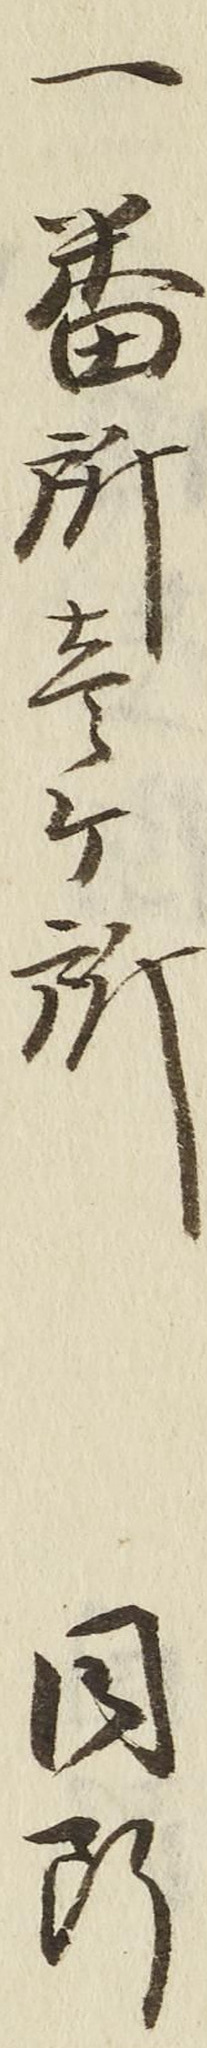一番所壱ヶ所同断
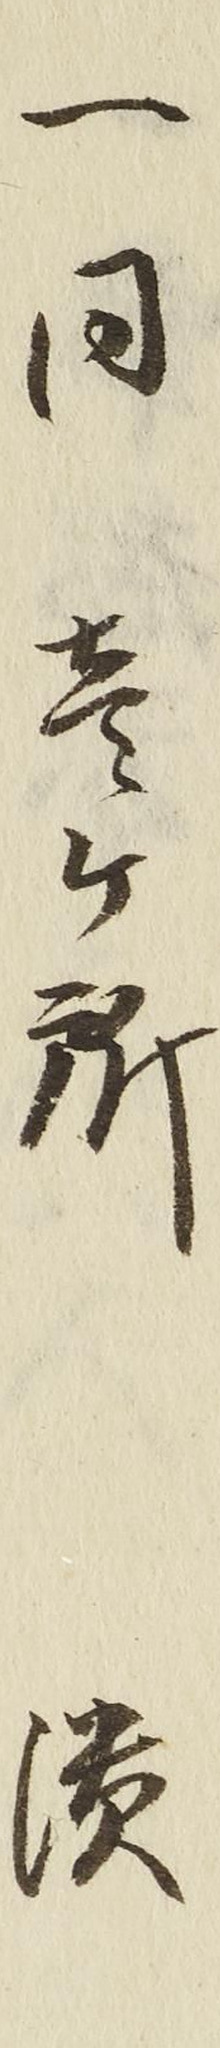一同壱ヶ所潰
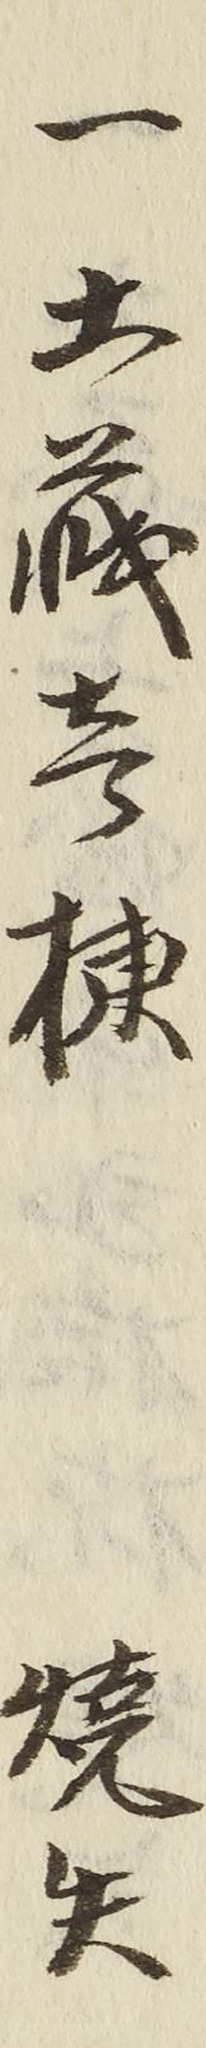一土蔵壱棟焼失
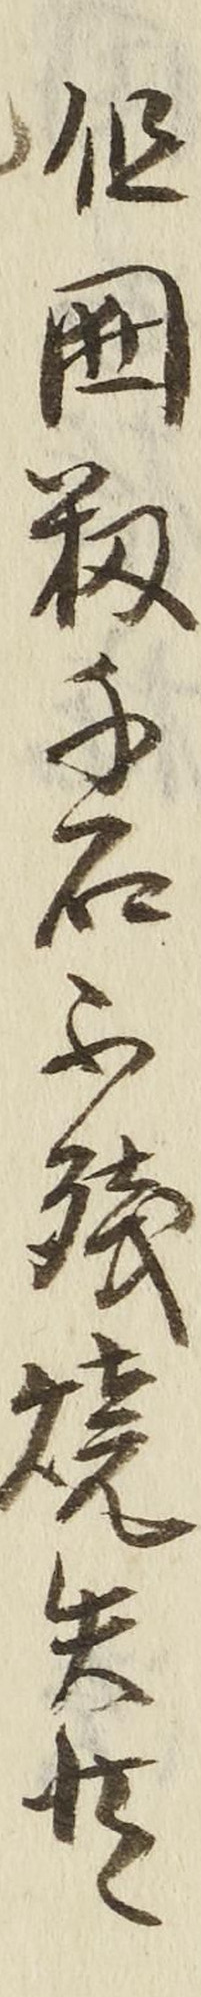但囲籾千石不残焼失仕候
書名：信濃國大地震記　乾
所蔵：東京大学地震研究所図書室 Earthquake Research Institute Library, The University of Tokyo, JAPAN
